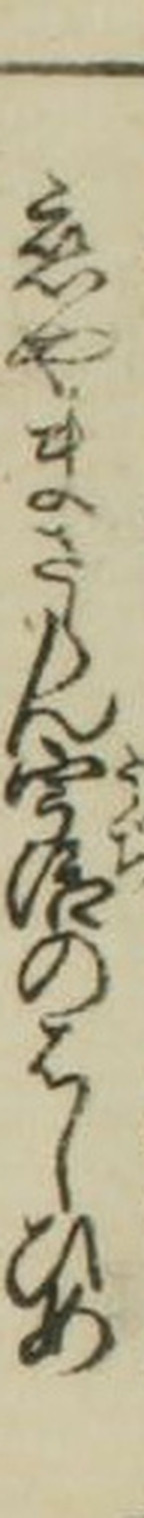恋やまさらん宇治のはしひめ
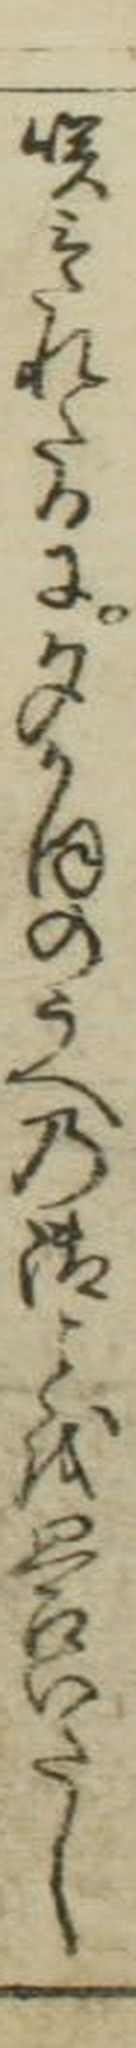咲みたれたるに。夕かほのうへの御ことを思召いたし
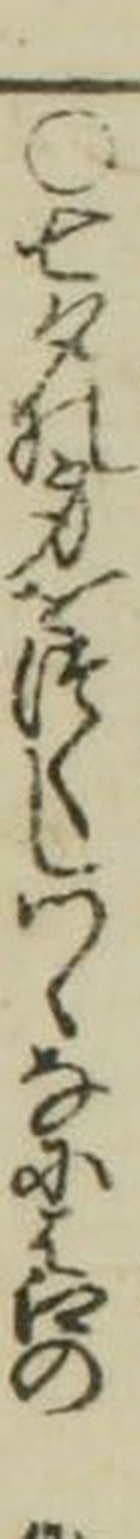○七夕の身をつくしつゝなには江の雅量
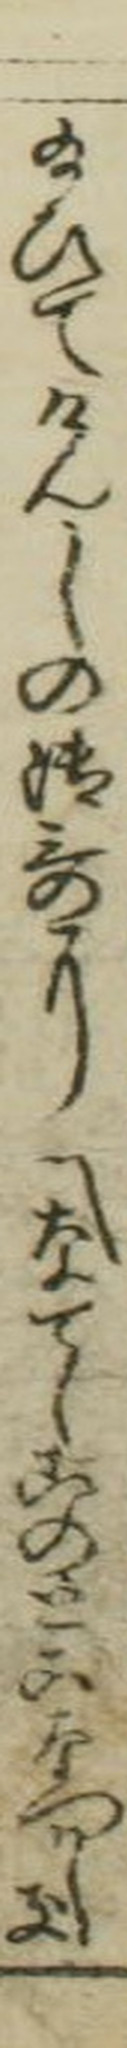給ひてけんしの御哥に〽なてしこのとこなつかしき
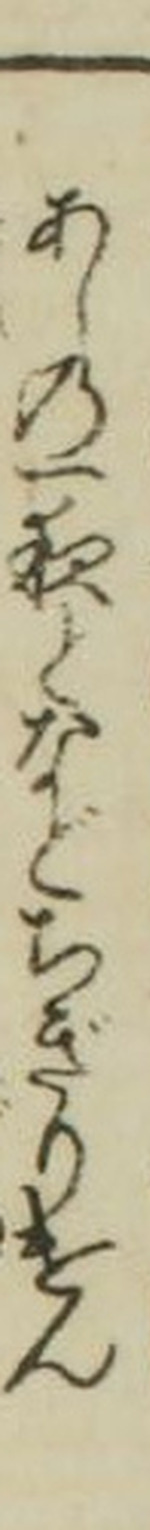あしの一夜となどちぎりけん
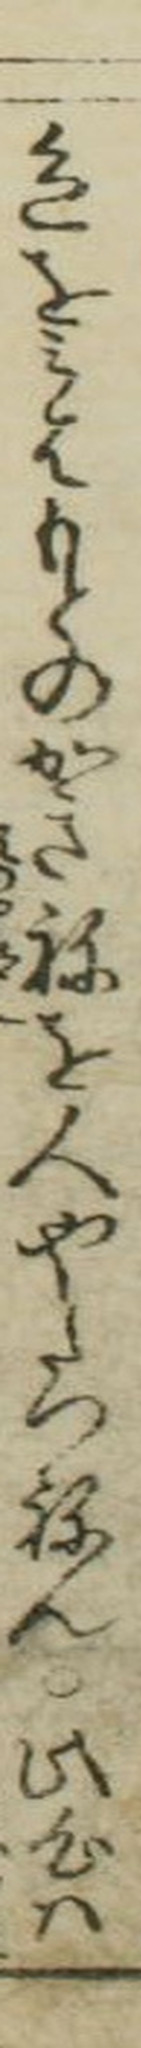色をみはもとのかきねを人やたつねん○此心は
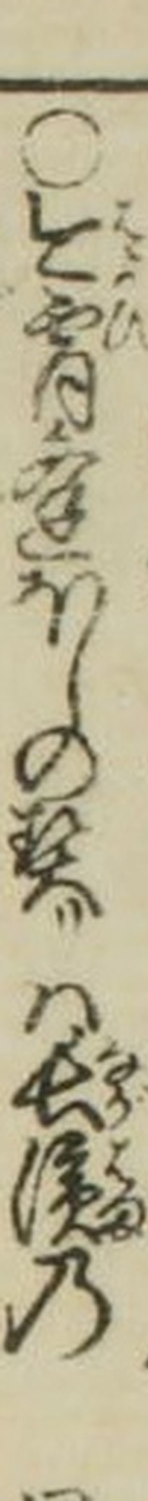○今宵逢ほしの契りは長浜の同
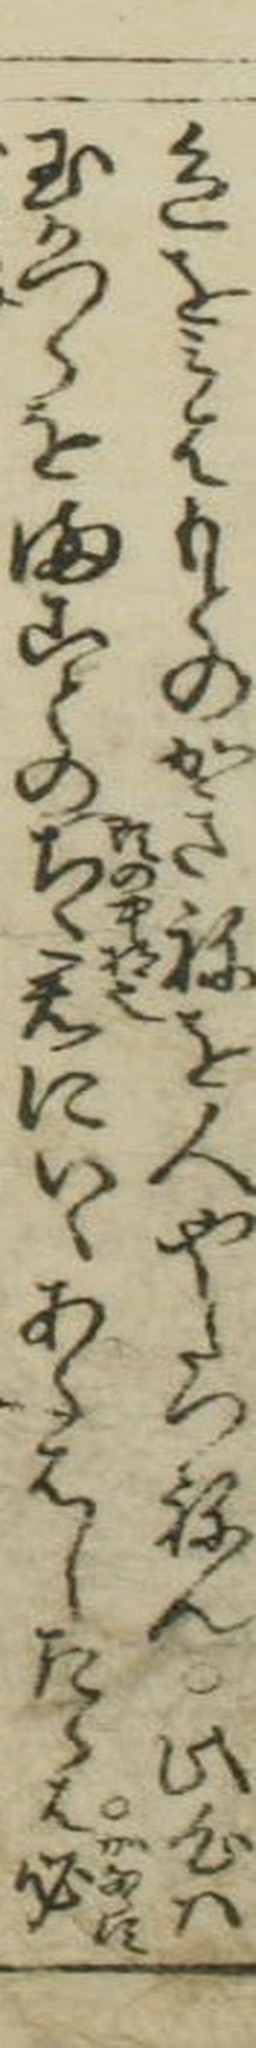玉かつらをまことのちゝ君にいゝあらはしたらは。必
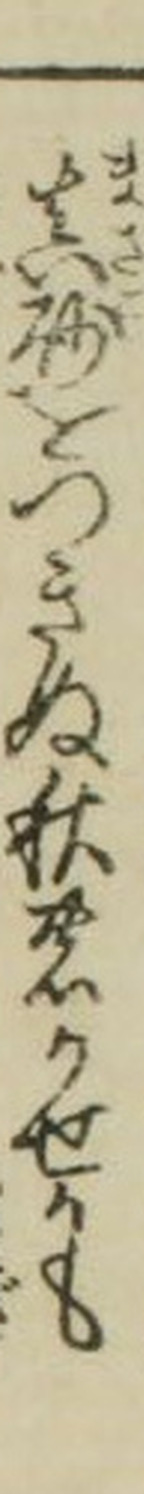真砂をつきぬ秋のかせかも
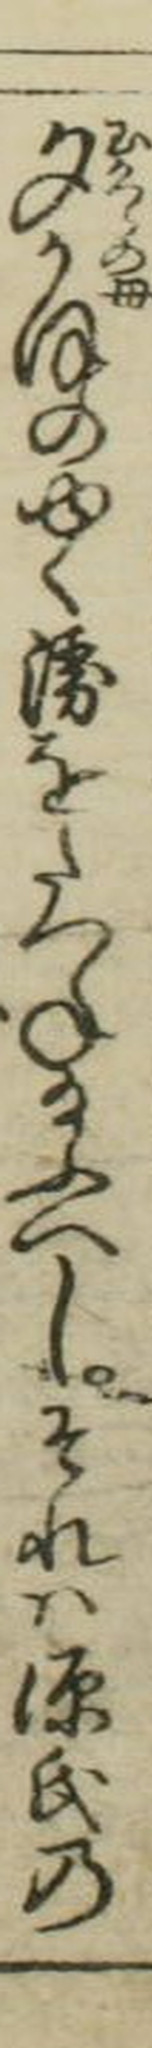夕かほのゆくゑをたつね給ふへし。それは源氏の
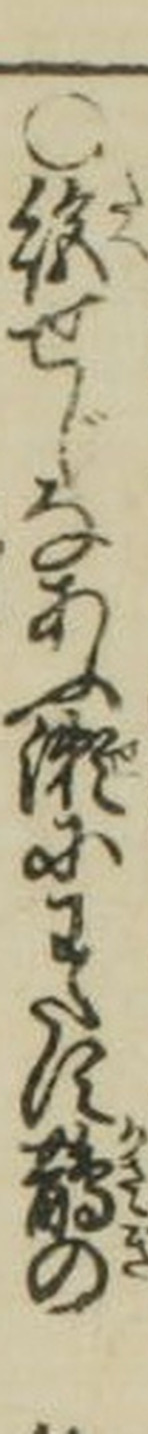○絶せじなあふ瀬にわたす鵲の経慶
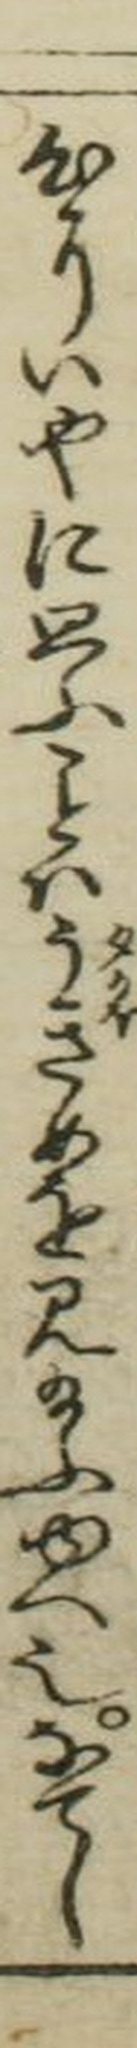心にいやに思ふことはうきめを見給ふゆへ也。なてし
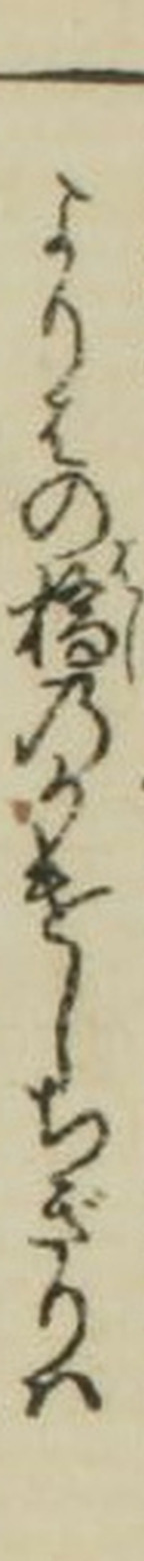よりはの橋のかけしちぎりは
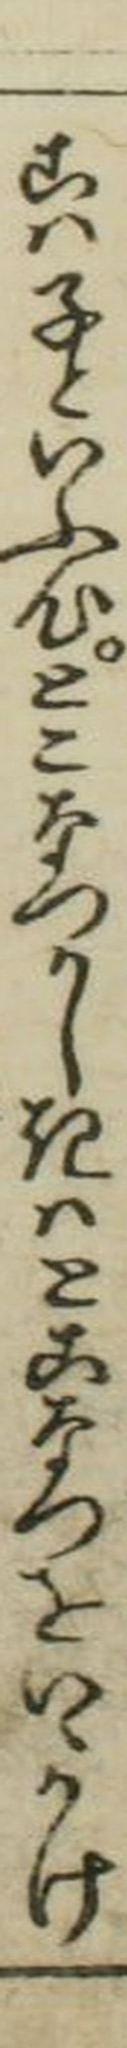こは子といふ心。とこなつかしきはとこなつをいゝかけ
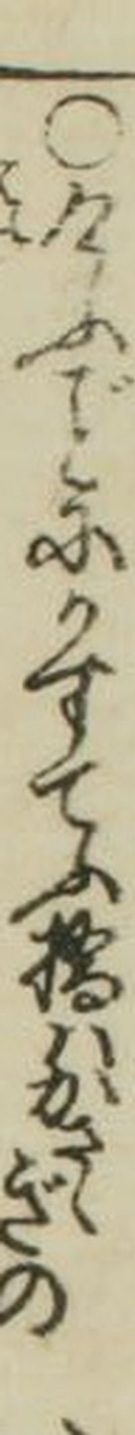○けふごとにかすてふ橋はかさゝぎのよみ人
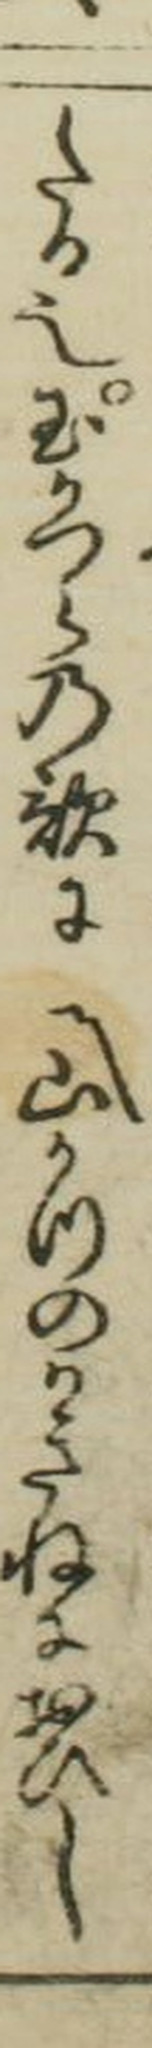たる也。玉かつらの歌に〽山かつのかきねにおひし
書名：女源氏教訓鑑
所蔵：東京学芸大学附属図書館
